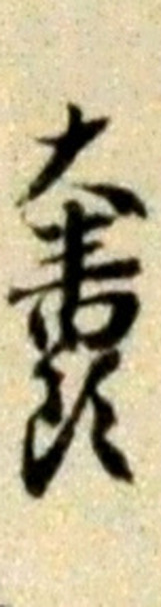大番頭
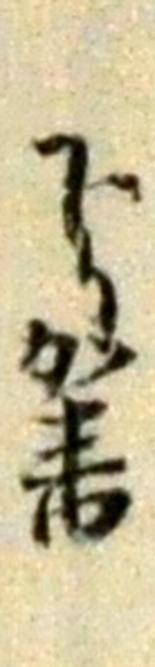下り加番
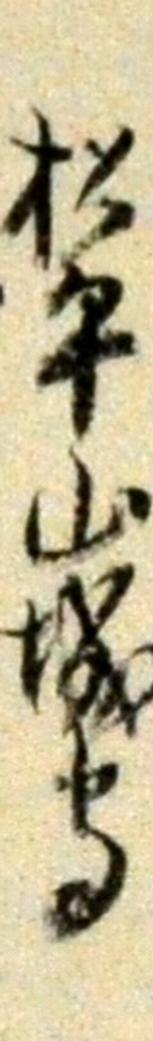松平山城守
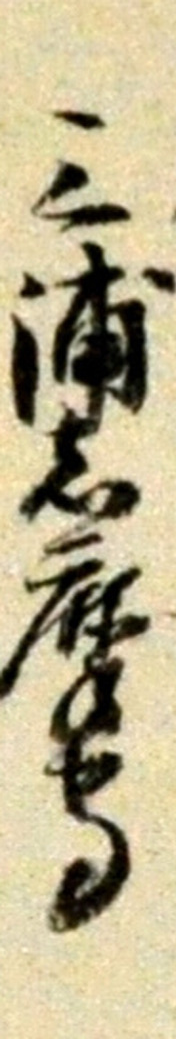三浦志摩守
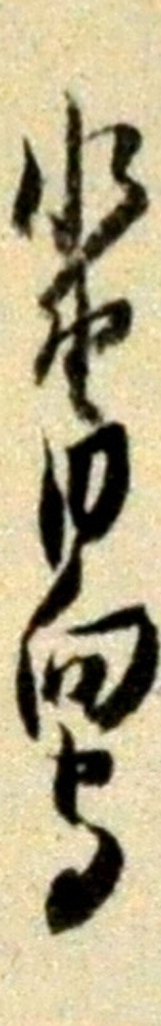水野日向守
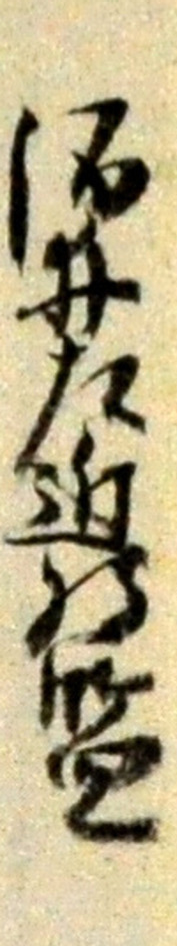酒井左近将監
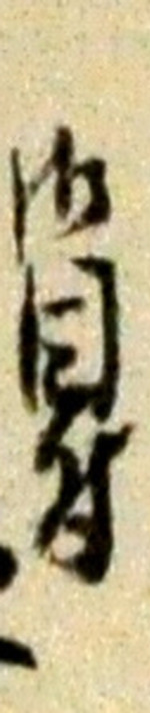御目付
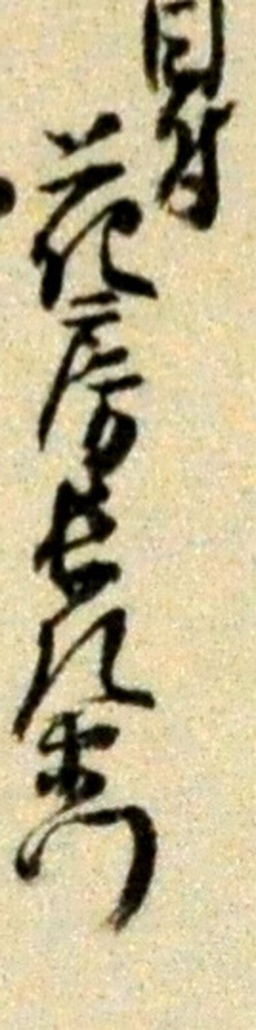花房長左衛門
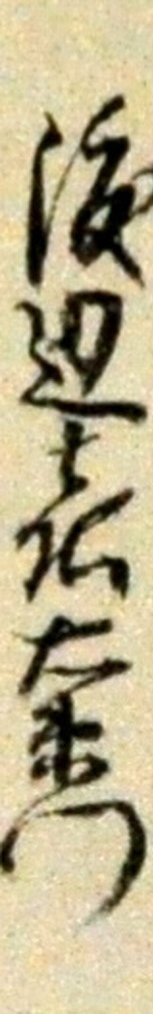渡辺嘉右衛門
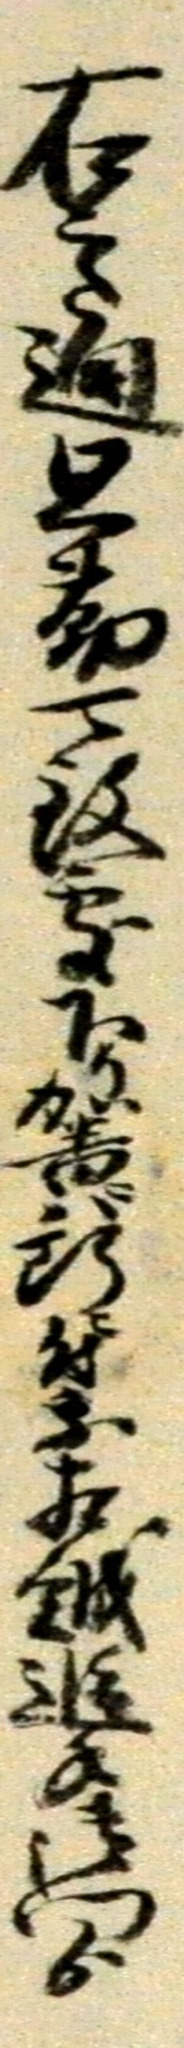右之通廻勤可致處下り加番ハ頭ニ付等相越追手御門ゟ
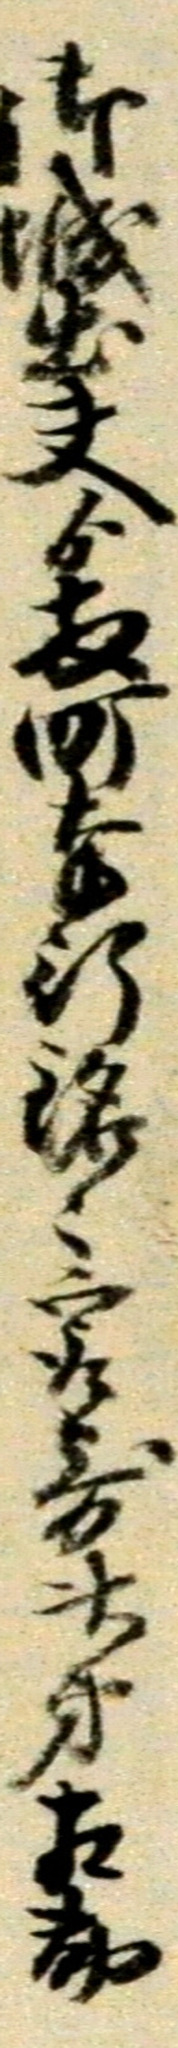御城出夫ゟ両町奉行所銘々最寄次第相勤
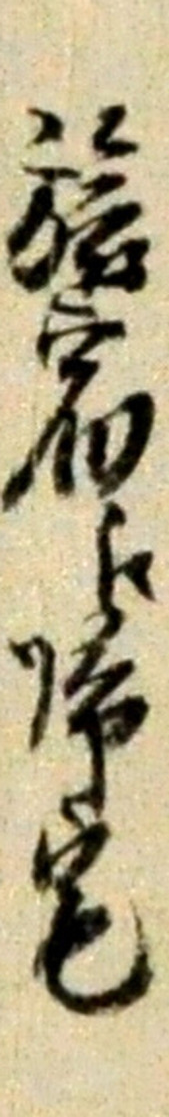旅宿江帰宅
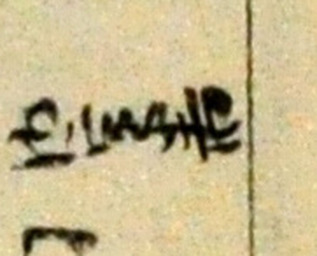御定番
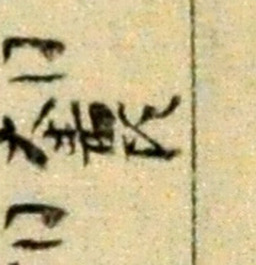大番頭
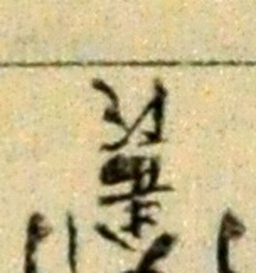大番頭
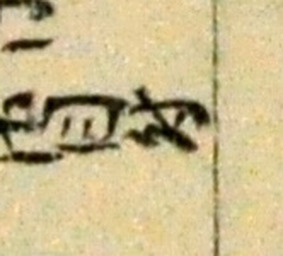御目付
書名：大阪加番関係諸書留〔一括〕
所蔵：伊那市立高遠町図書館・合同会社AMANE
